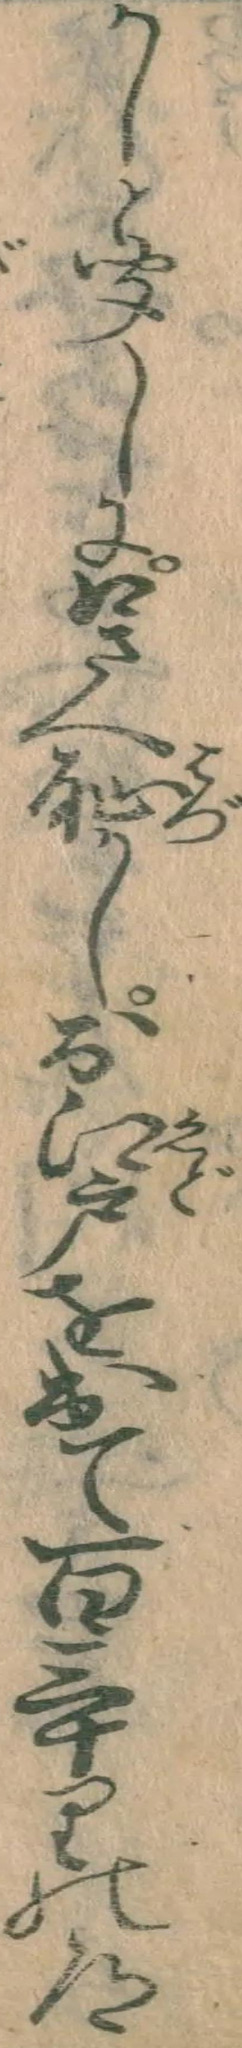かしと聞しに。口さへ恥かし。お江戸を出て百三十里の道
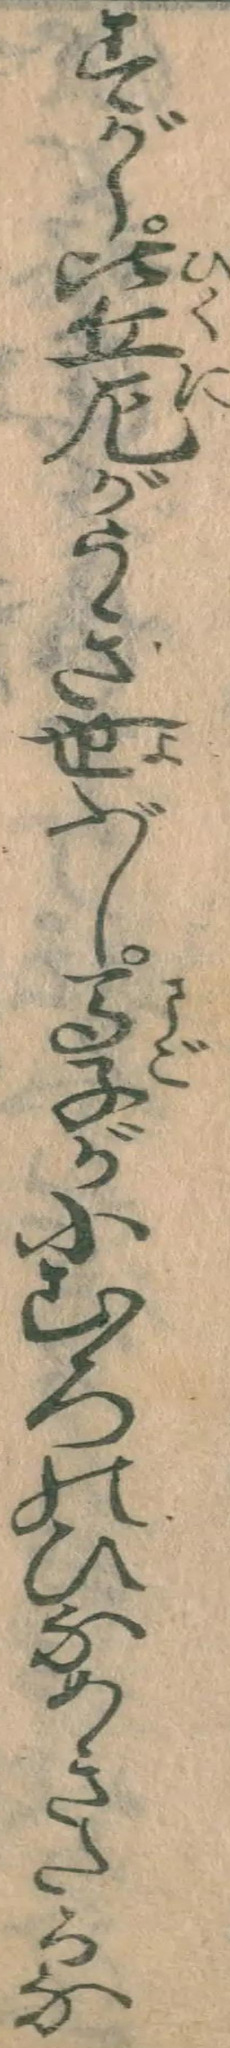すがら。比丘尼がうき世ぶし。馬子が小むろのひなめきたるな
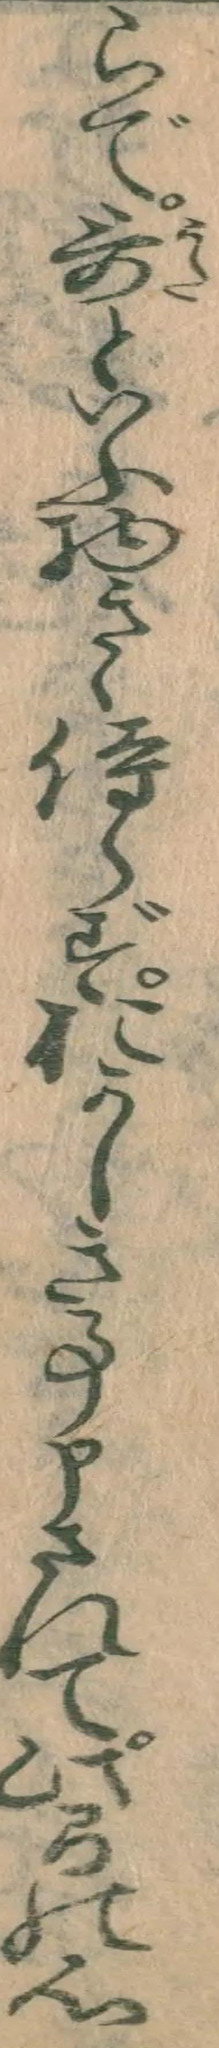らで。歌といふ物きゝ侍らず。おかしき事申されて。此間の心
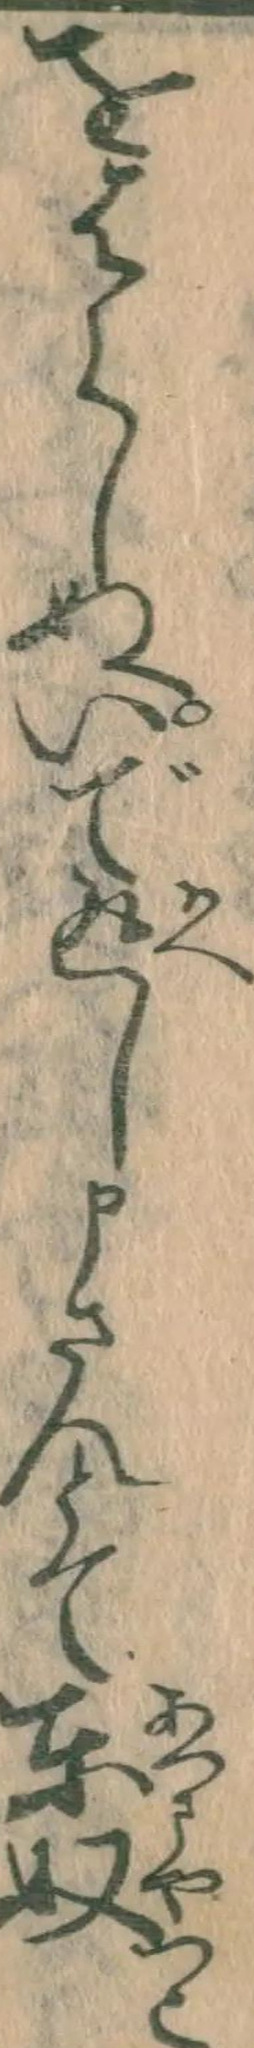をはらしぬ。いで返し申さんとて東奴
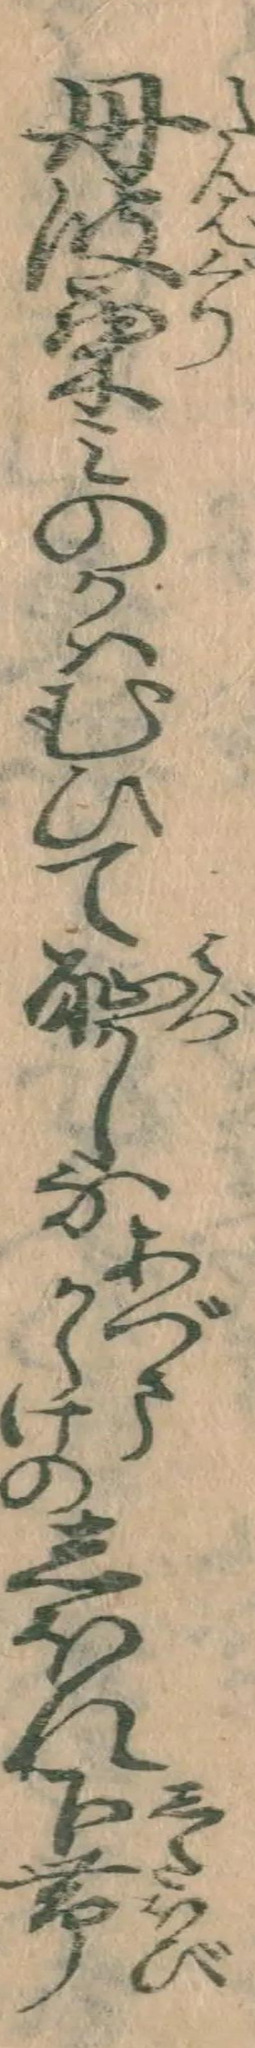丹波栗みのかはむひて恥かしなあづまからけのしほれ下帯
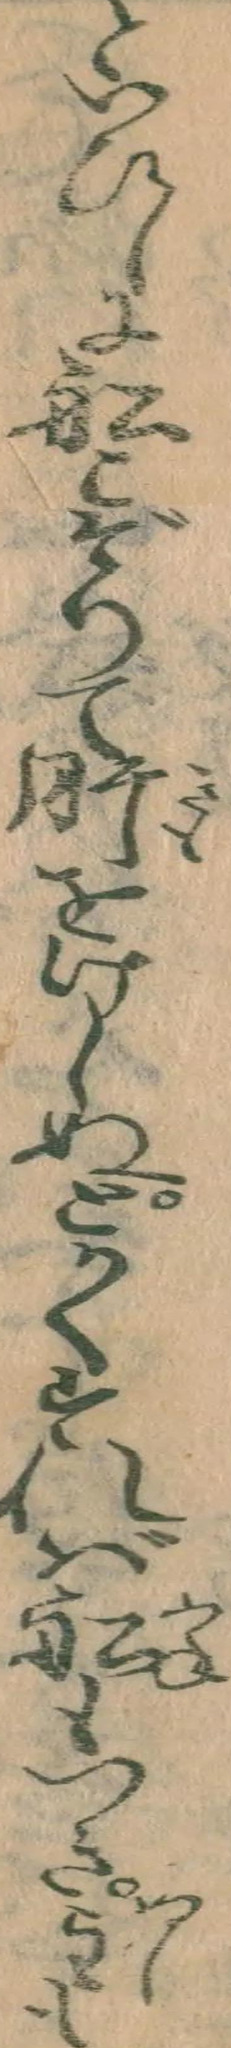といひしに船こぞりて肝をけしぬ。とかくすれば船もつき。主も
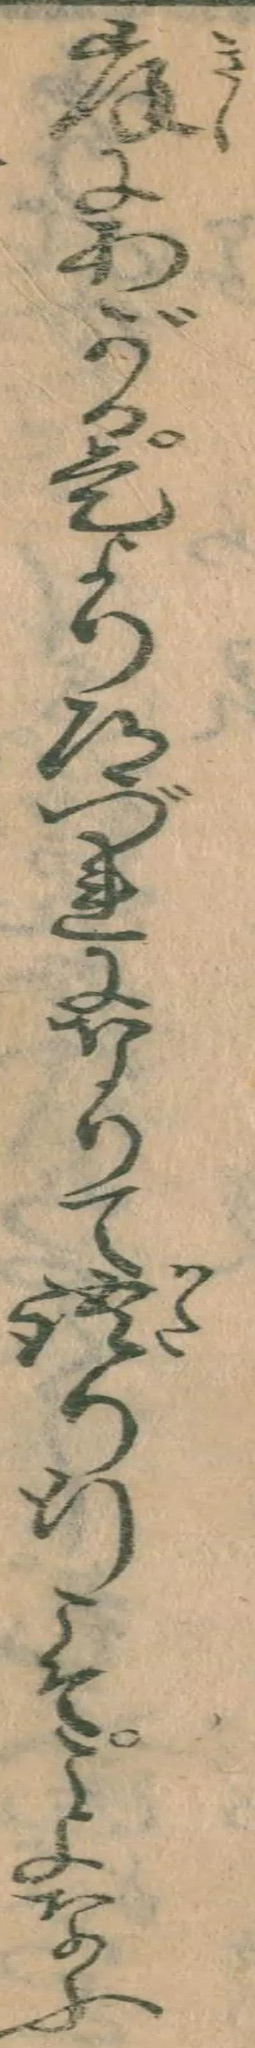岸にあがる。是より道づれになりて語り行こそ。こよなふ
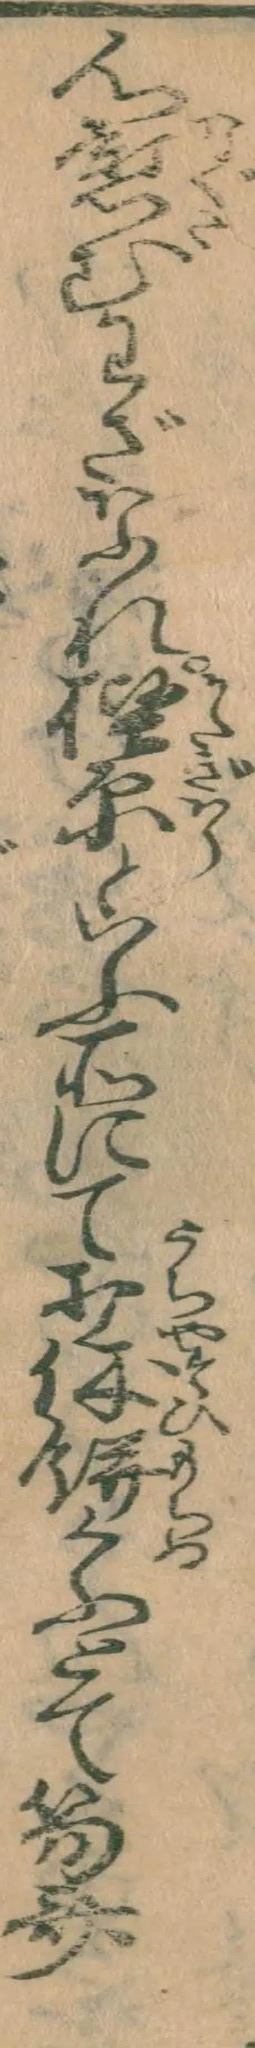心慰むわざなれ。樫原といふ所にて打休餅くふとて筍斎
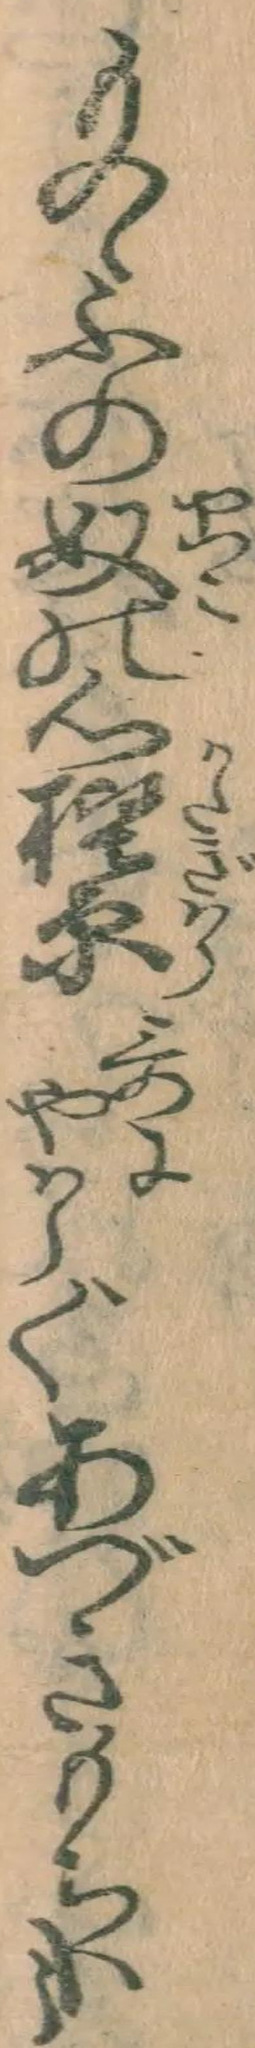ものゝふの奴の心樫原歌にやはらぐあづきもちかや
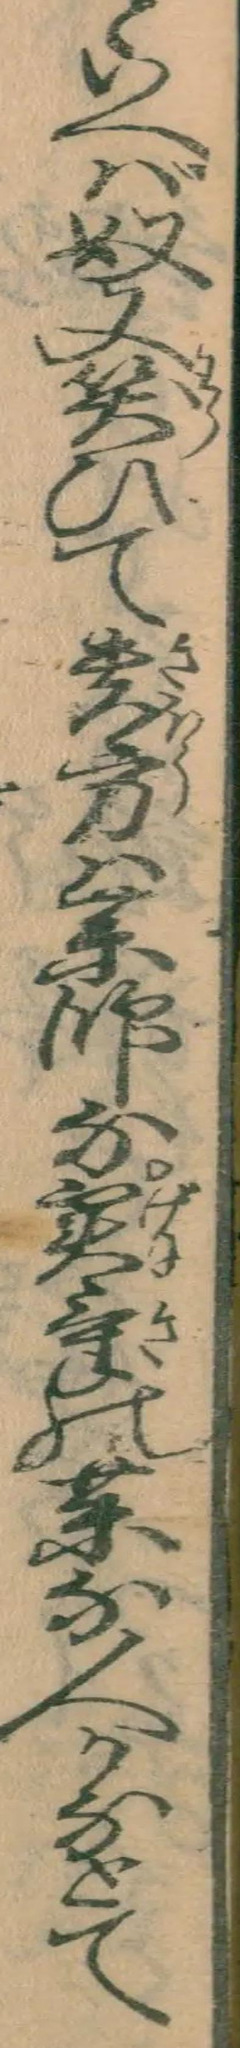といへば奴又笑ひて貴方は薬師な。実気の薬な人かなとて
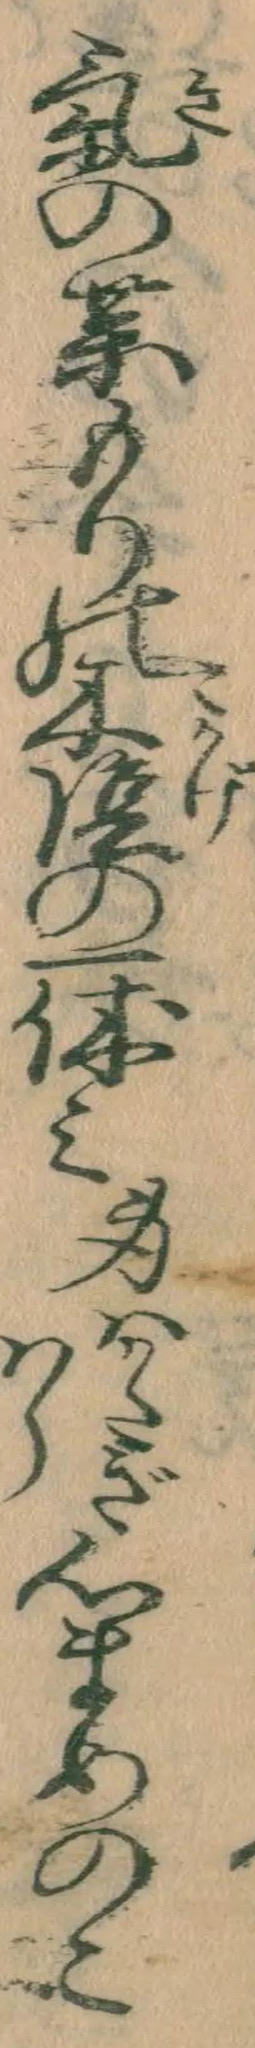気の薬もりの木陰の一休み身はかたぎはら心まめのこ
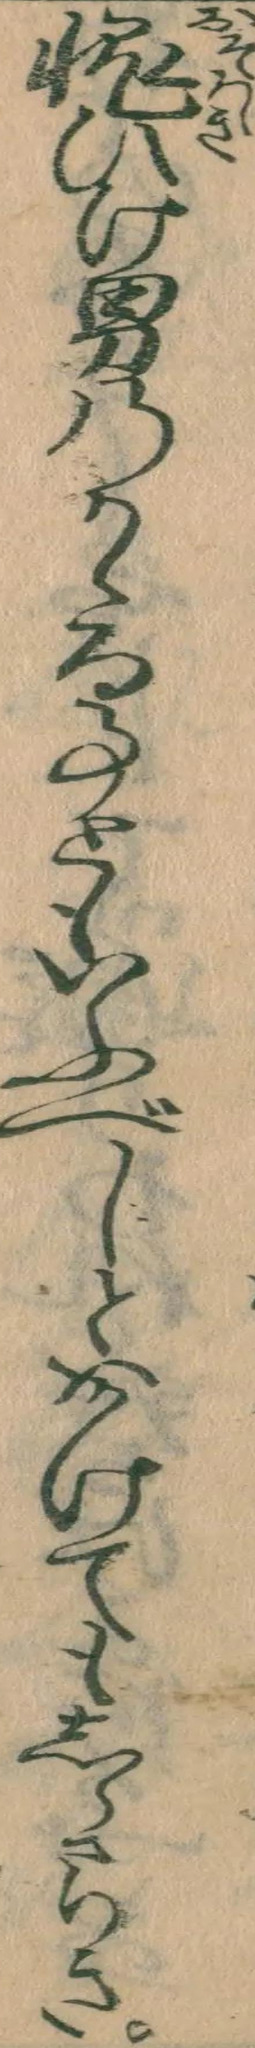恐ひけ男のかゝる事ともいふべしとはかけてもしらさりき。
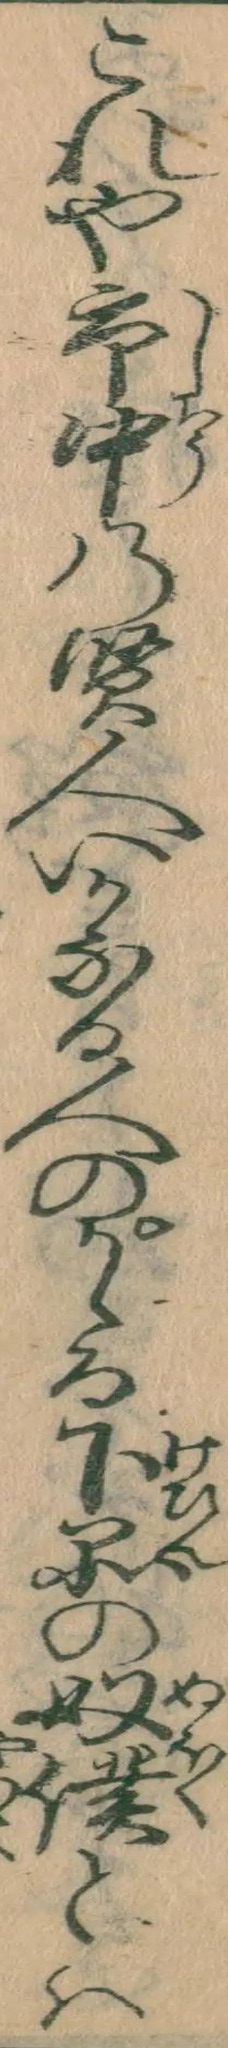これや市中の賢人いかなる人の。かゝる下品の奴僕とは
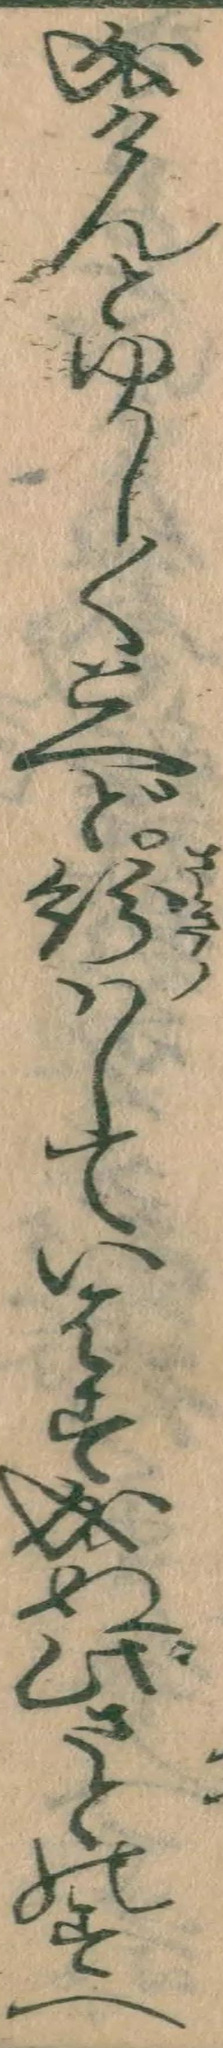成けんとゆかし〱とへど。紛はしていはす成ぬ。此さとのすへ
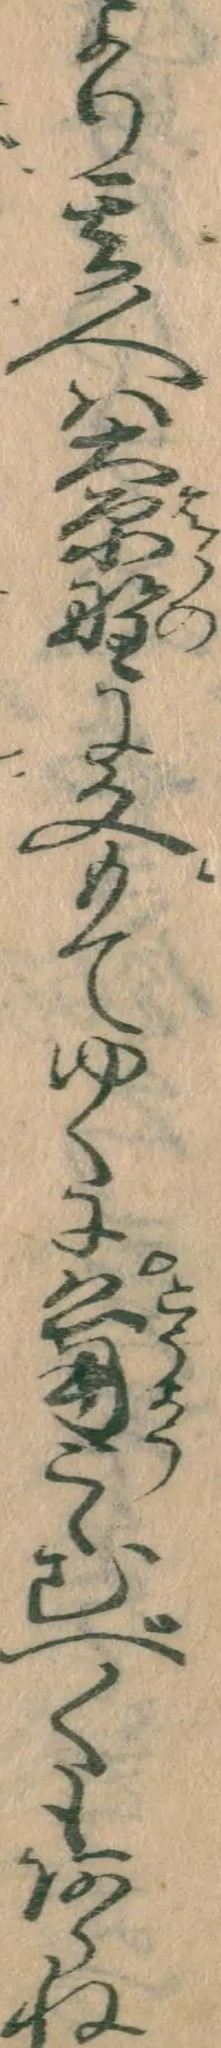より其人は大原野に文もてゆくに。公用とゝむべ〱もあらね
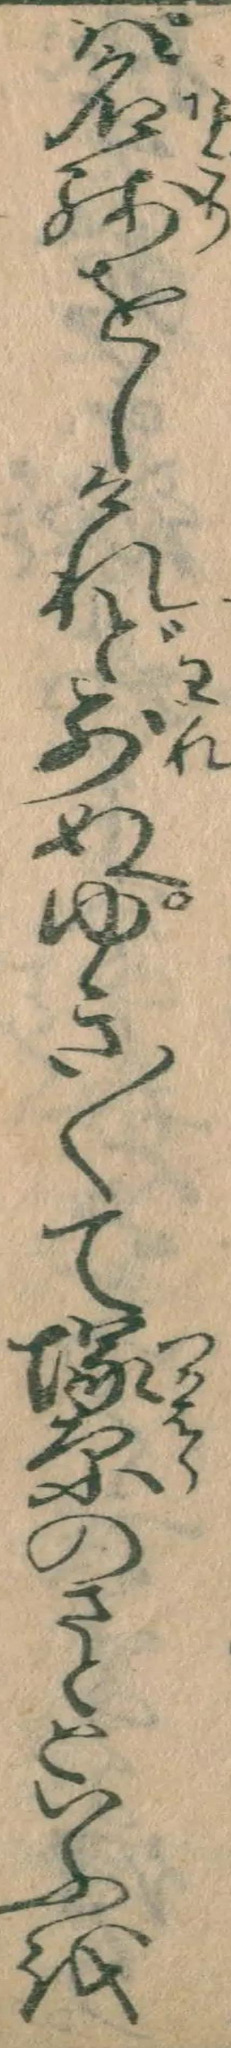ば残をしけれど別ぬ。ゆき〳〵て塚原のさとといふを
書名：新竹斎 5巻
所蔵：国立国会図書館 National Diet Library, JAPAN
